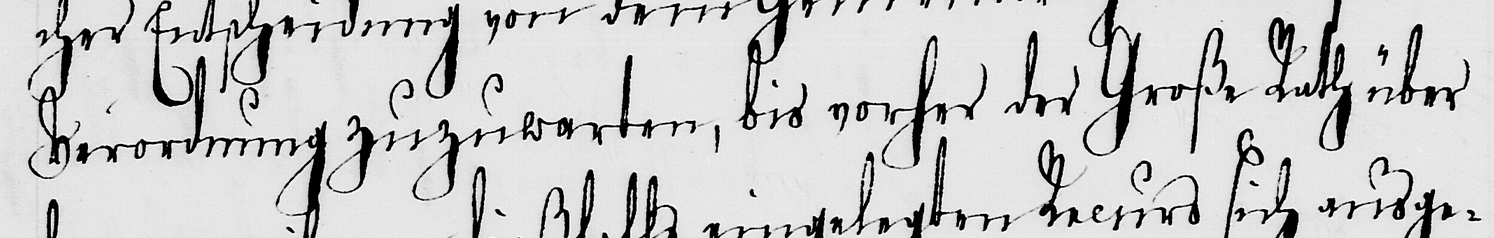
Verordnung zuzuwarten, bis vorher der Große Rath über
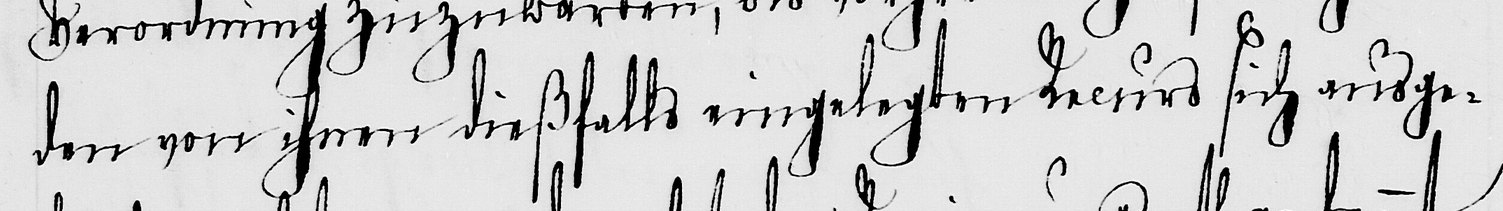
den von ihnen dießfalls eingelegten Recurs sich ausge¬
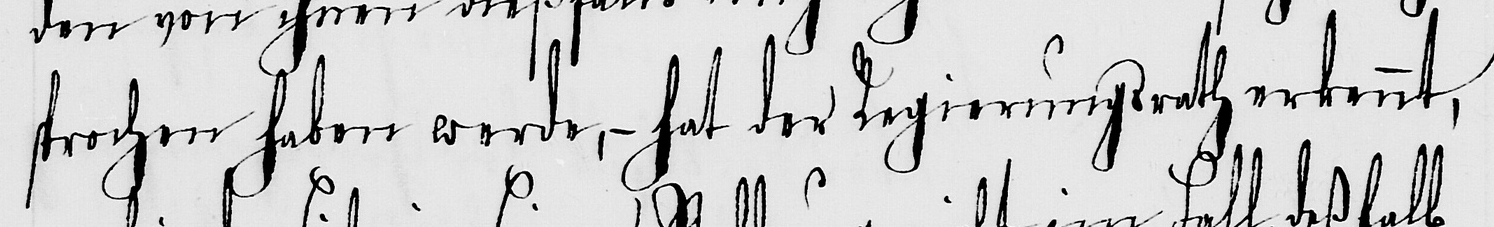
sprochen haben werde, – hat der Regierungsrath erkennt,
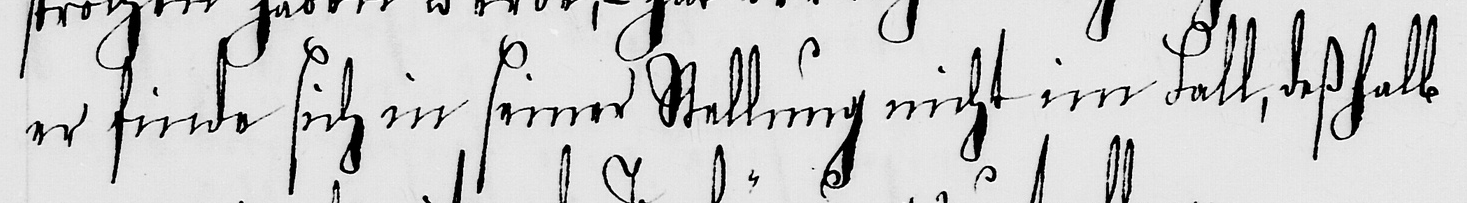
er finde sich in seiner Stellung nicht im Fall, deßhalb
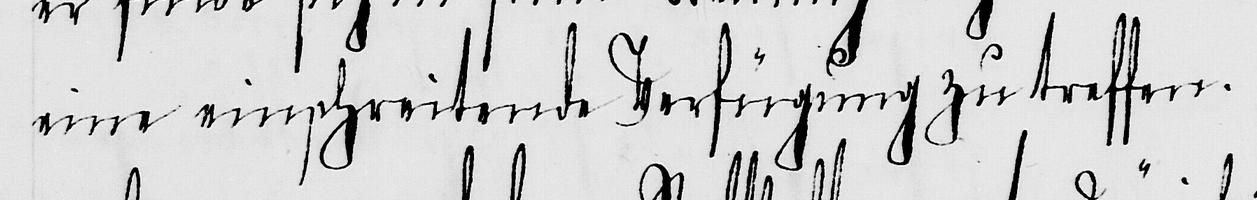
eine einschreitende Verfügung zu treffen.
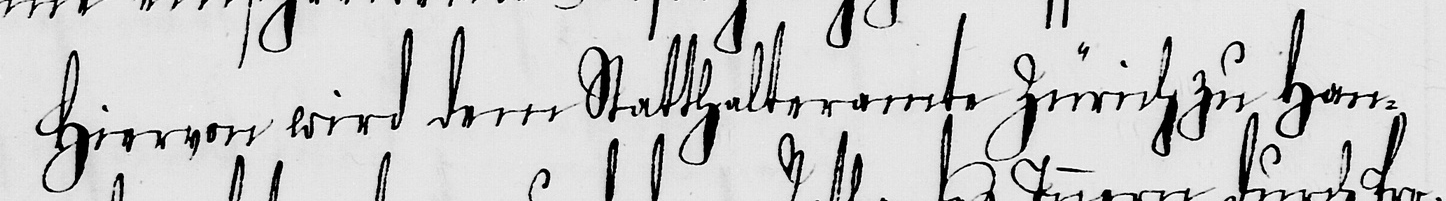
Hiervon wird dem Statthalteramte Zürich zu Han¬
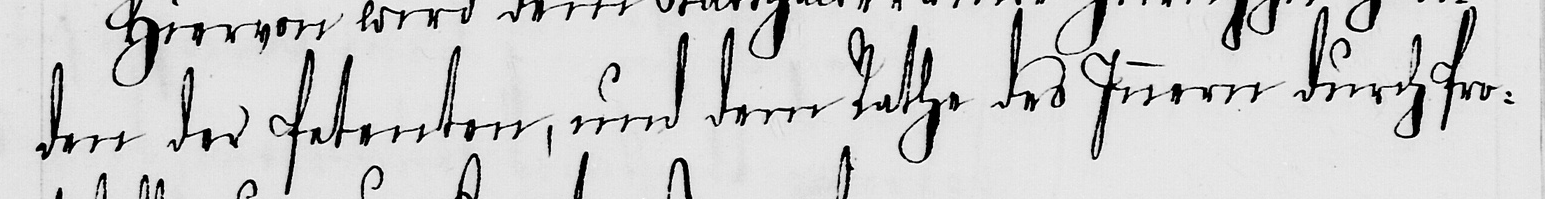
den der Petenten, und dem Rathe des Innern durch Pro¬
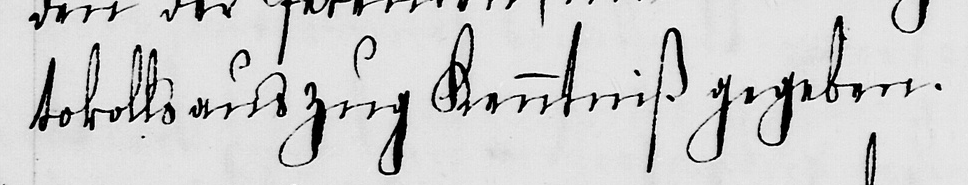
tokollsauszug Kenntniß gegeben.
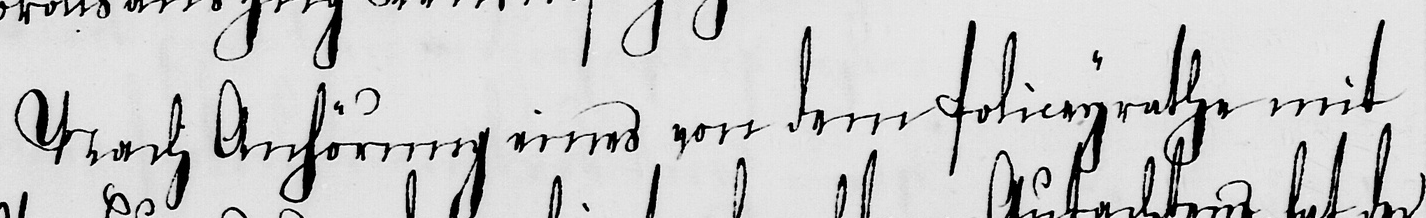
Nach Anhörung eines von dem Policeyrathe mit
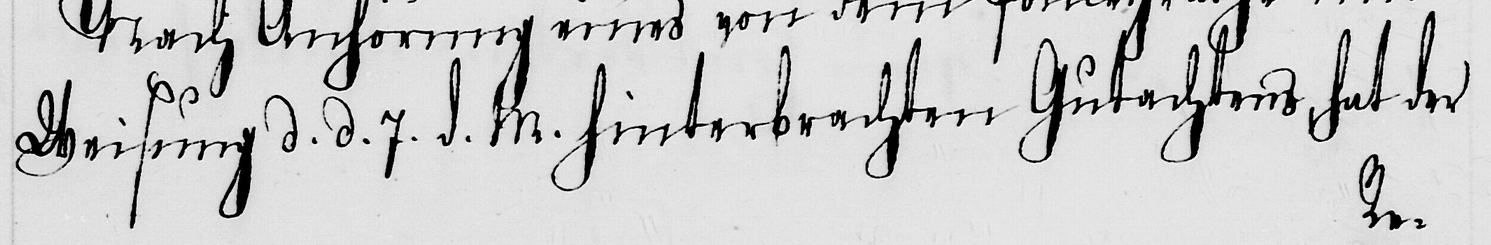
Weisung d. d. 7. d. M. hinterbrachten Gutachtens, hat der
